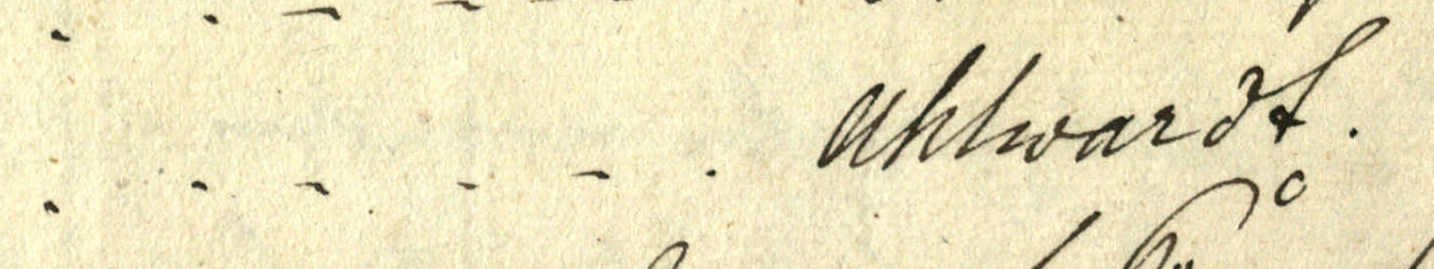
Ahlwardt.
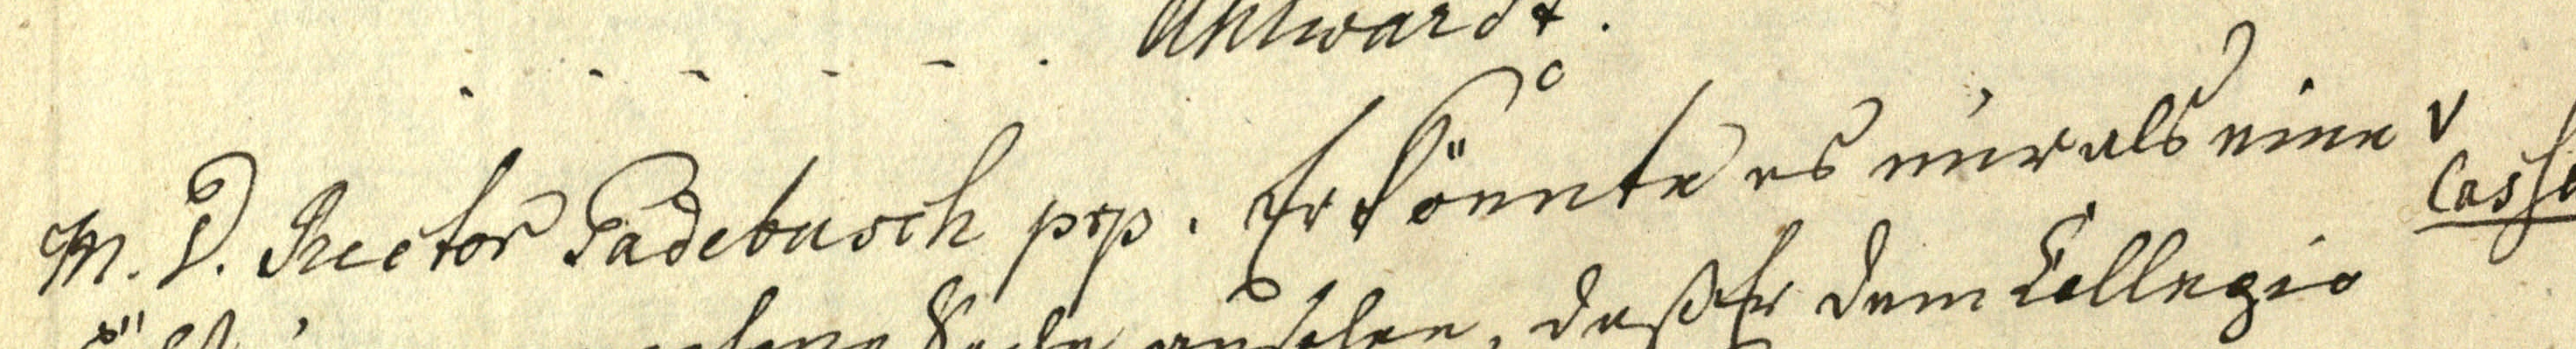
M. D. Rector Gadebusch prp. Er könnte es nur als eine
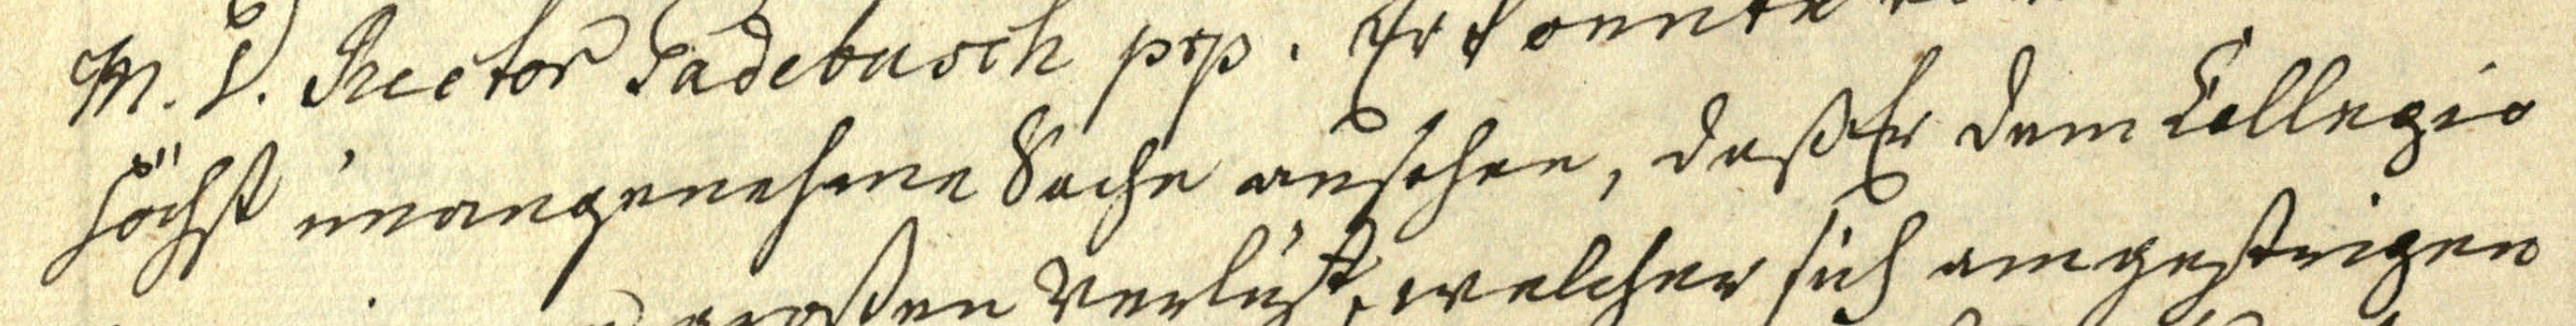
höchst unangenehme Sache ansehen, daß Er dem Collegio
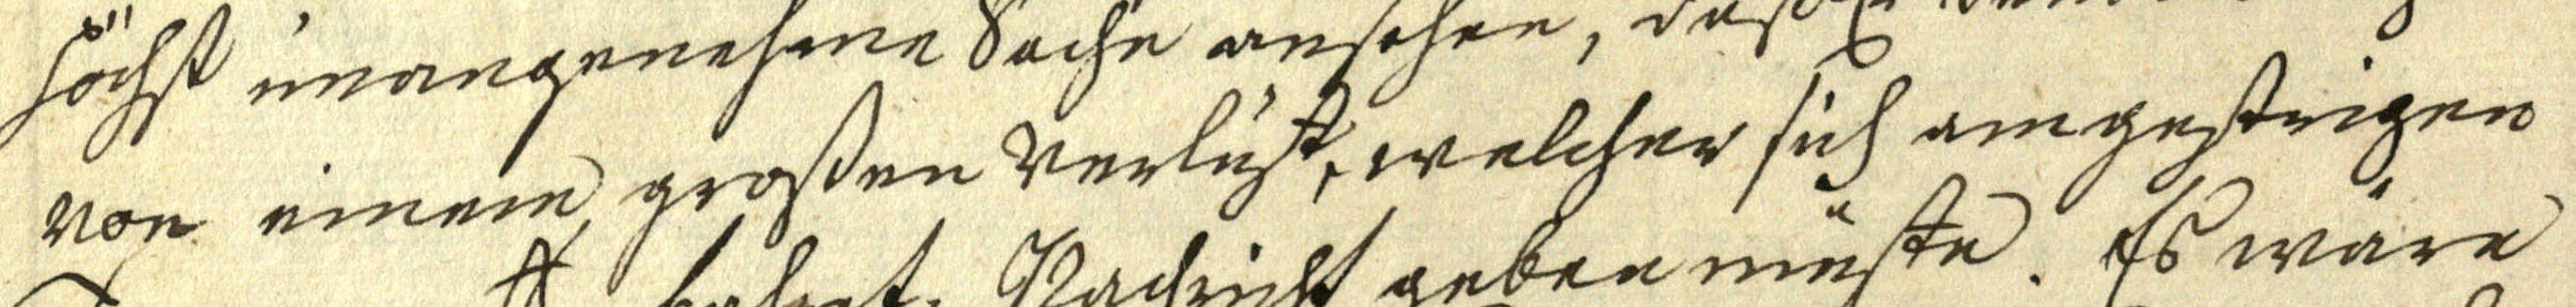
von einem großen Verlust, welcher sich am gestrigen
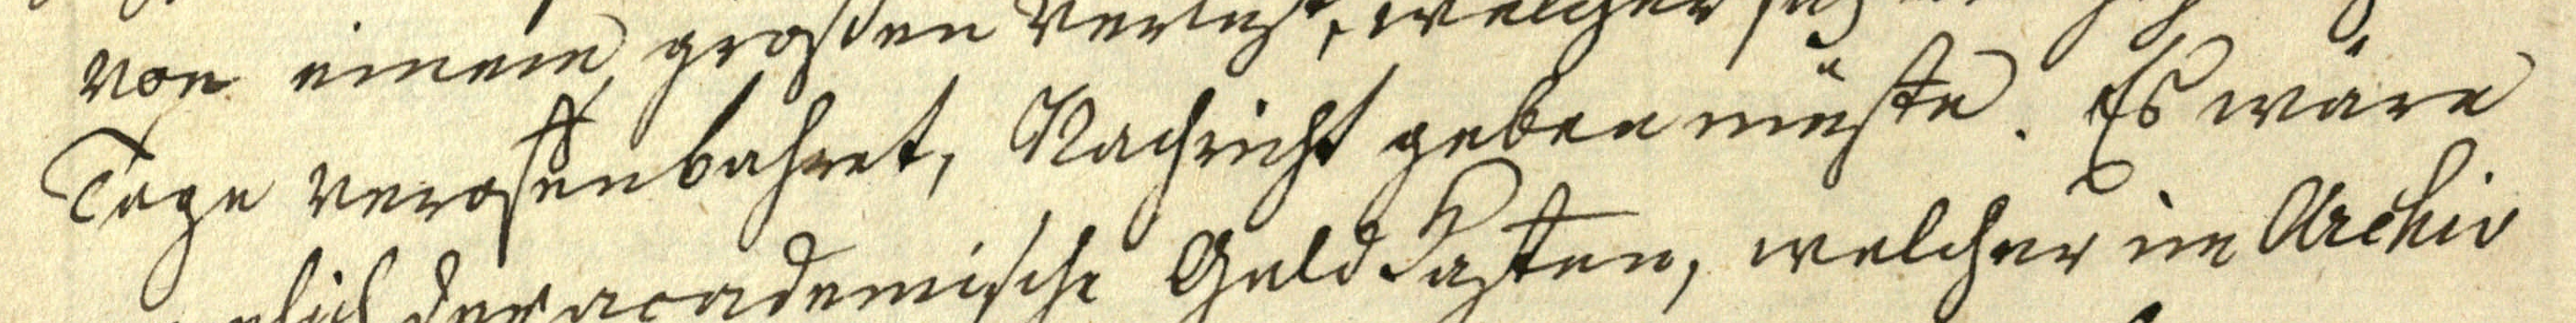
Tage veroffenbahret, Nachricht geben müste. Es wäre
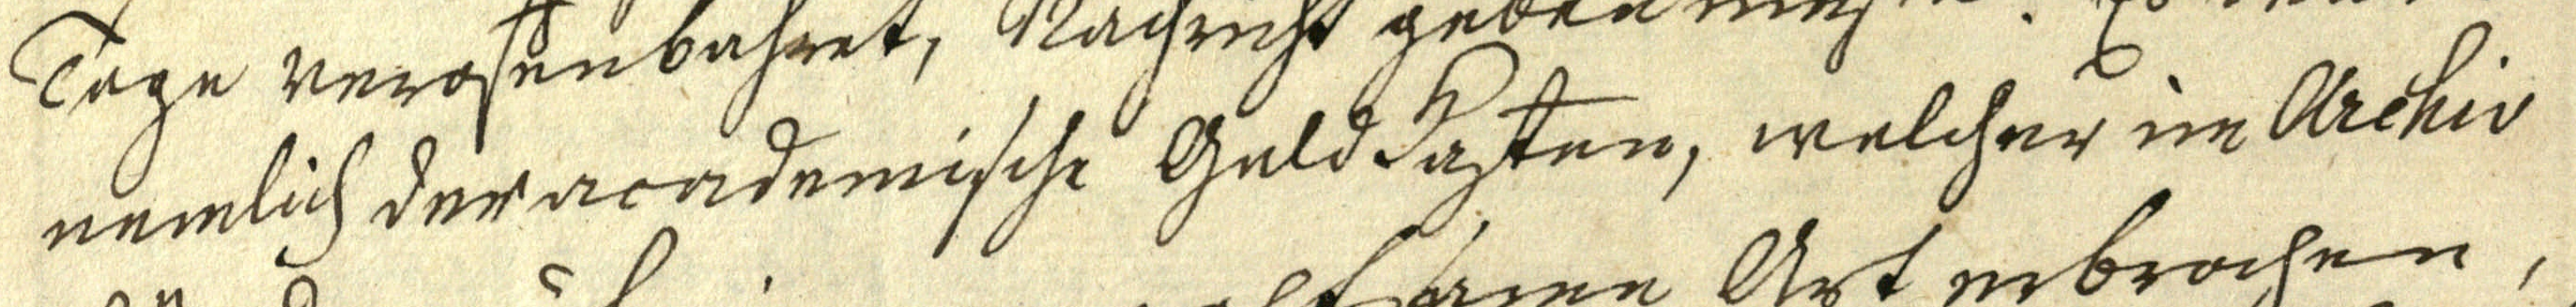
nemlich der academische Geld Kasten, welcher im Archiv
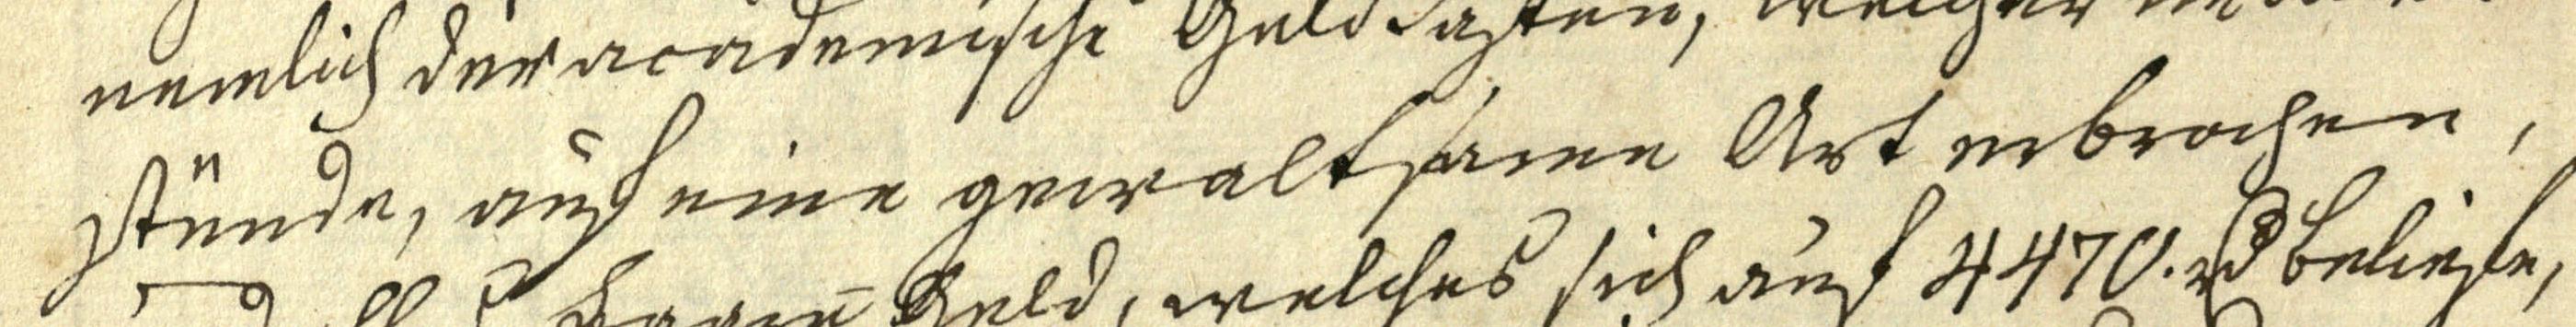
stünde, auf eine gewaltsame Art erbrochen,
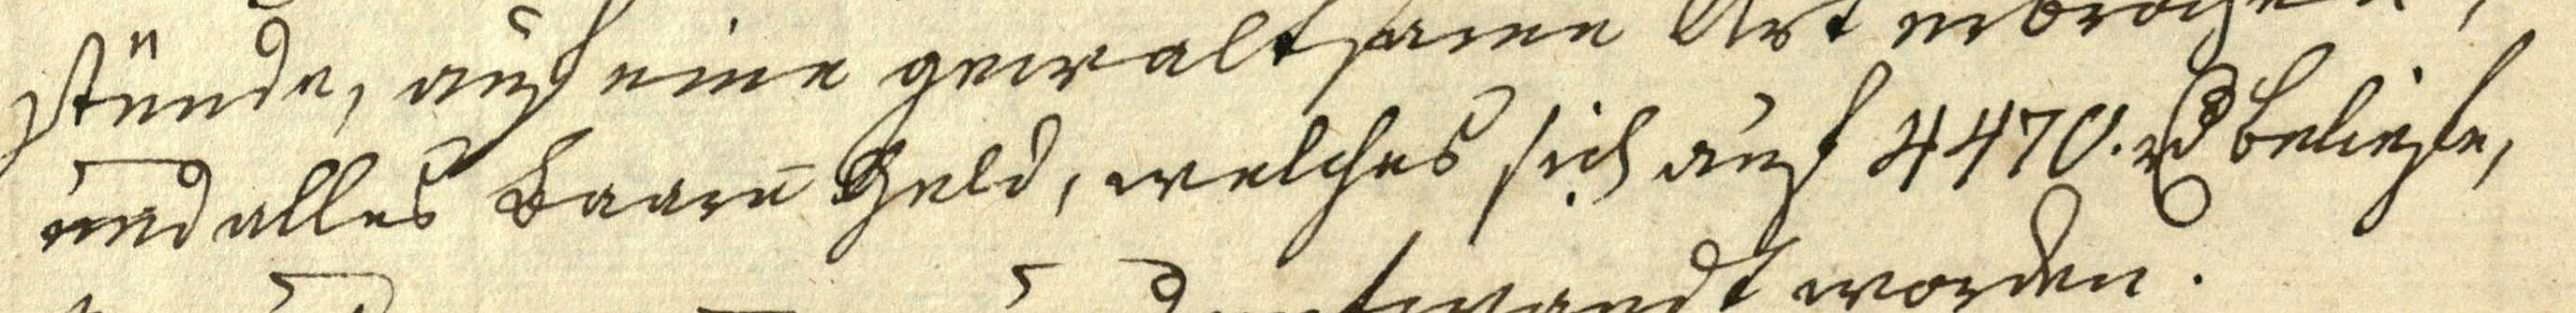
und alles baare Geld, welches sich auf 4470.rt beliefe,
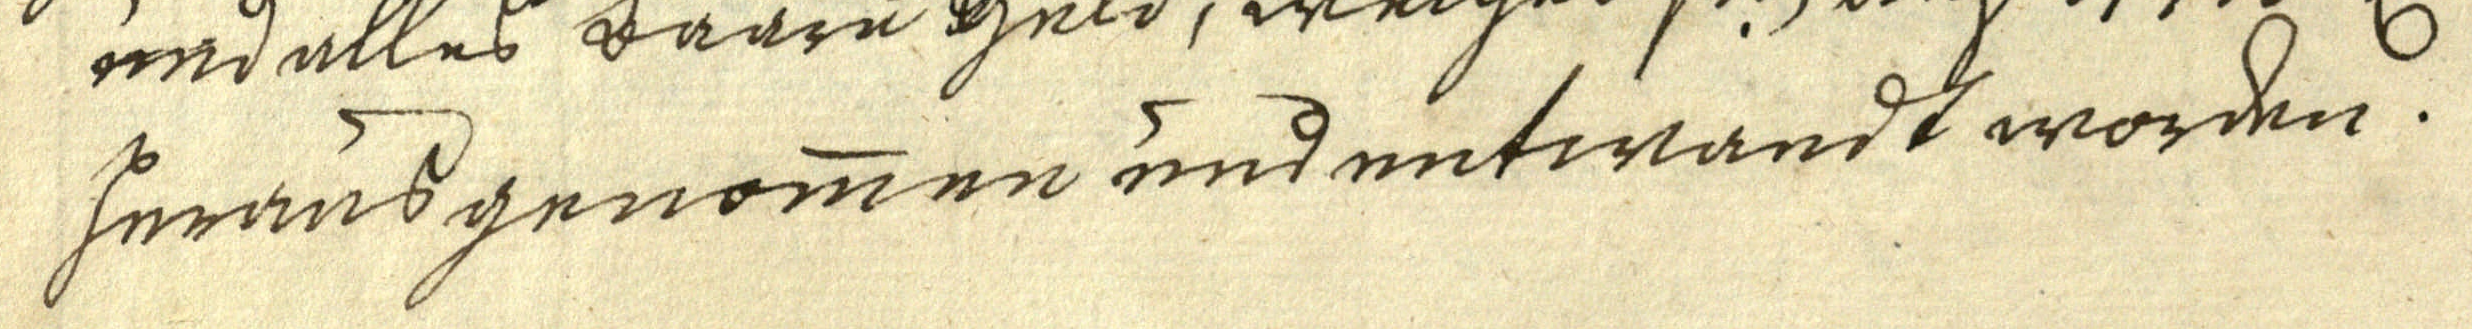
heraus genommen und entwandt worden.
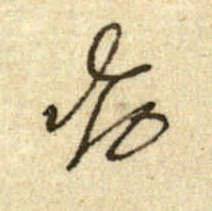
dh
